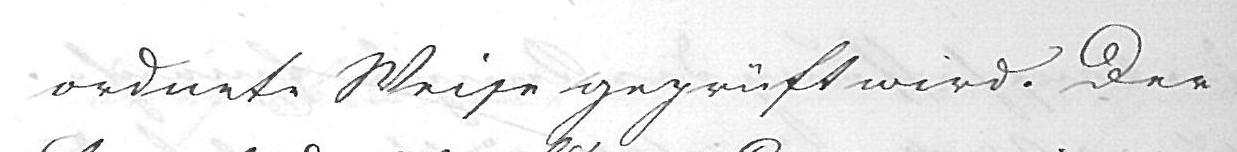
ordnete Weise gegrüft wird. Der
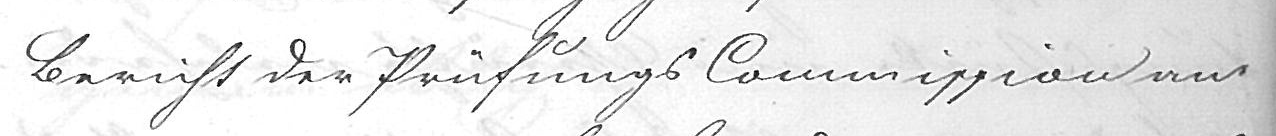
Bericht der PrüfungsCommission an
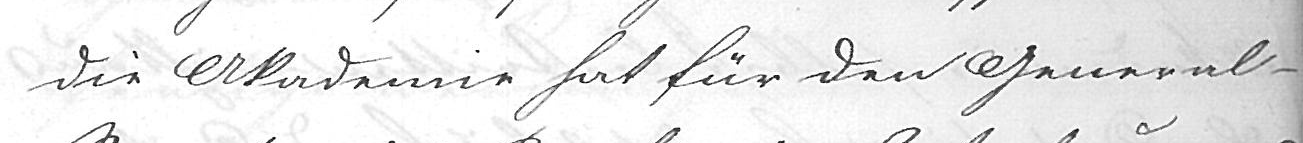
die Akademie hat für den General-
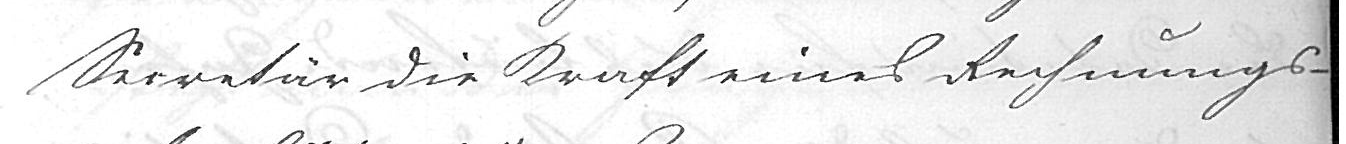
Secretär die Kraft eines Rechnungs-
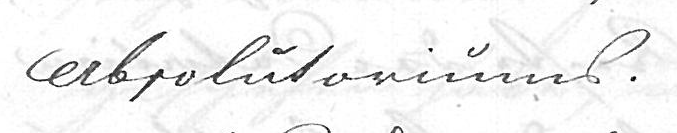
Absolutoriums.
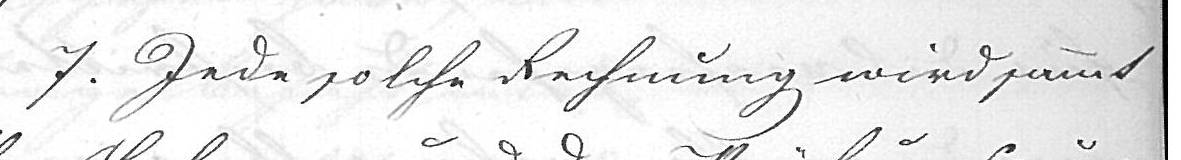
7. Jede solche Rechnung wird sammt
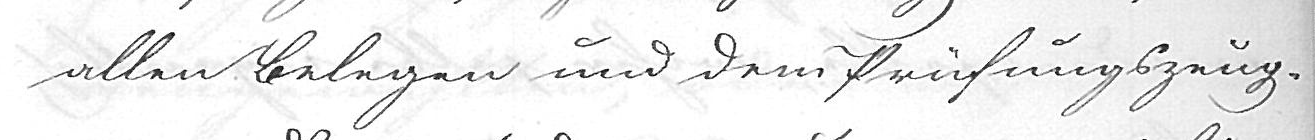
allein Belegen und dem Prüfungszeug-
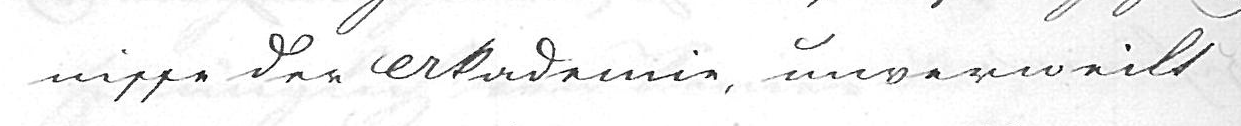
nisse der Akademie, unverweilt
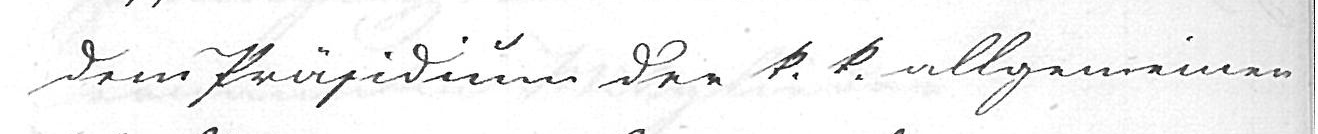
dem Präsidium der k.k. allgemeinen
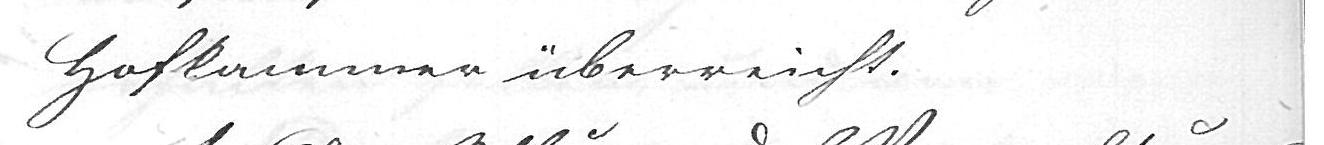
Hofkammer überreichte.
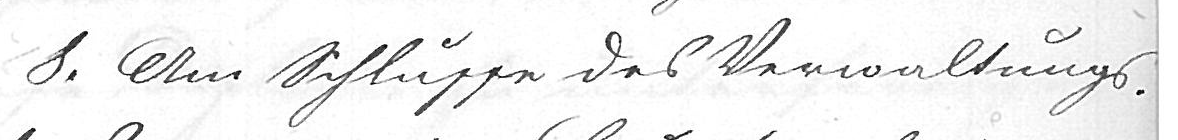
8. Am Schlusse: des Verwaltungs-
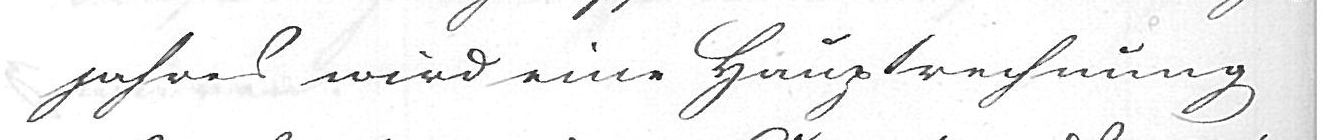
jahres wird eine Haunptrechnung
